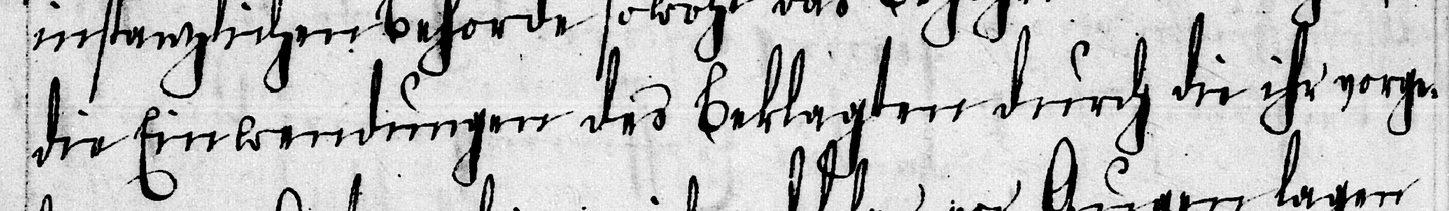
die Einwendungen des Beklagten durch die ihr vorg¬
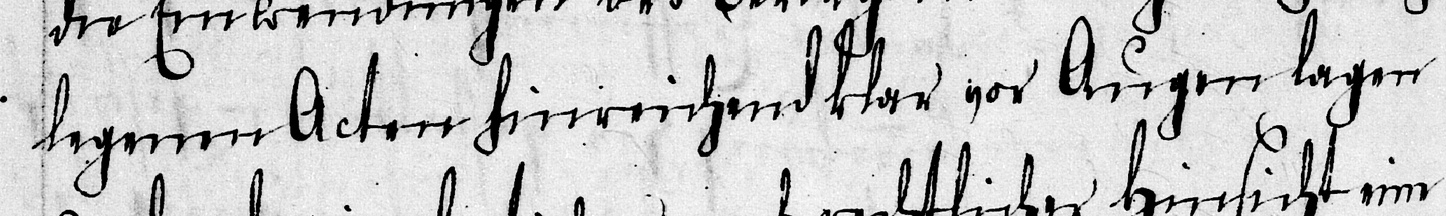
elegenen Acten hinreichend klar vor Augen lagen
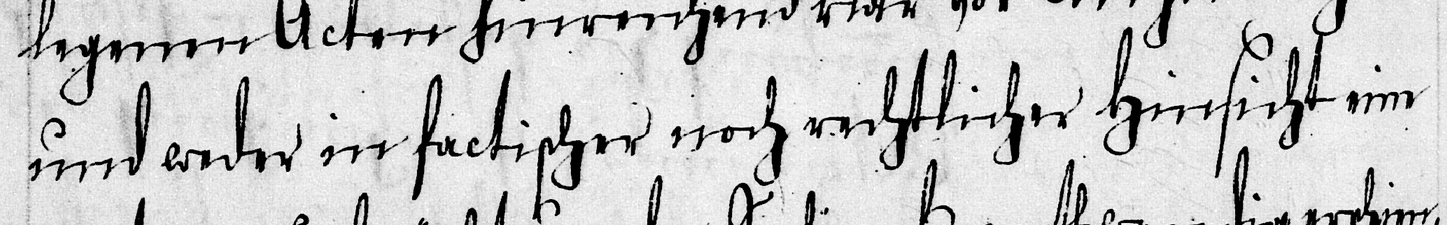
und weder in factischer noch rechtlicher Hinsicht eine
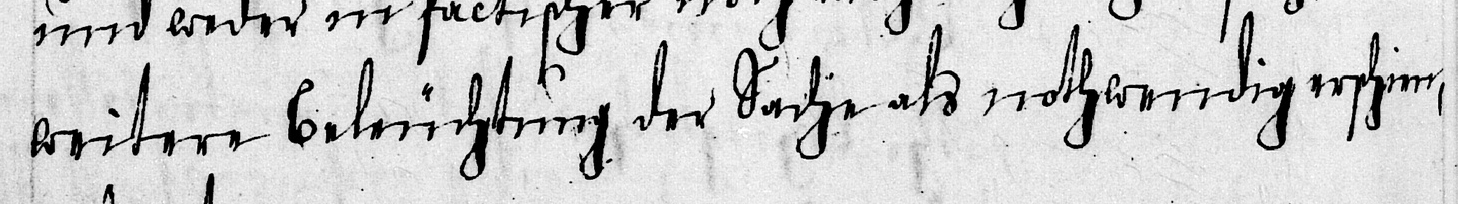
weitere Beleuchtung der Sache als nothwendig erschie¬
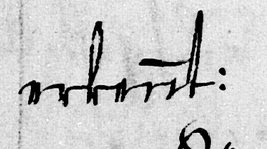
erkennt:
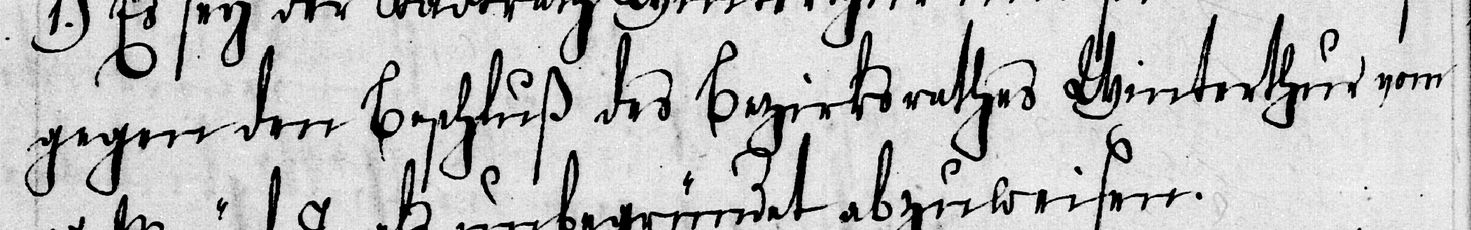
gegen den Beschluß des Bezirksrathes Winterthur vom
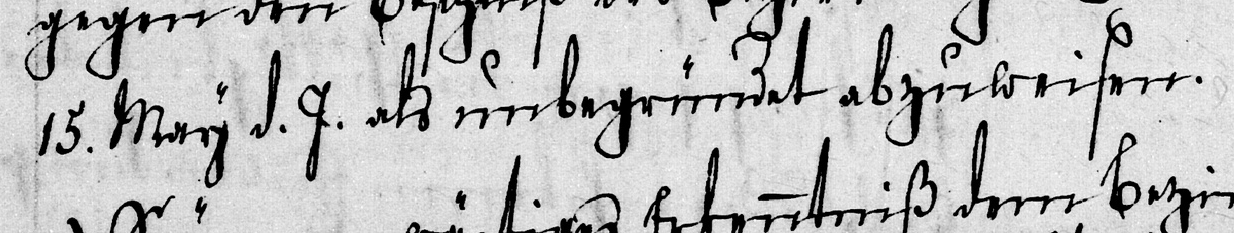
15. May d. J. als unbegründet abzuweisen.
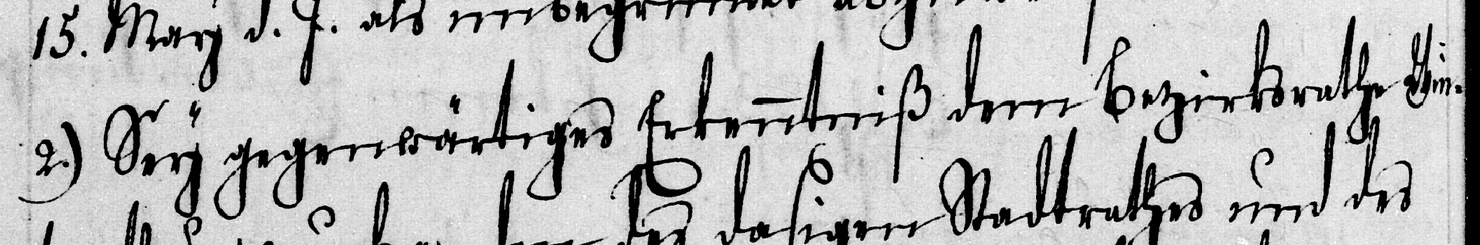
2.) Sey gegenwärtiges Erkenntniß dem Bezirksrathe Win¬
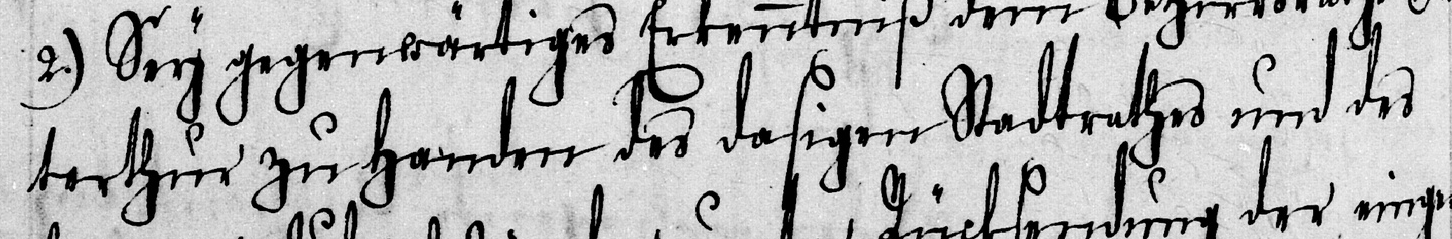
terthur zu Handen des dasigen Stadrathes und des
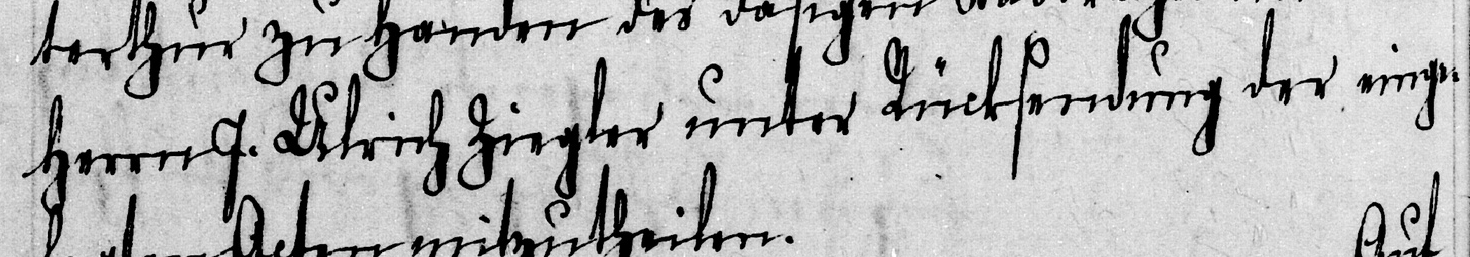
Herrn J. Ulrich Ziegler unter Rücksendung der eing¬
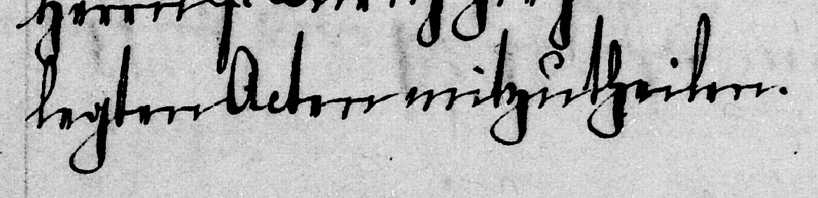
elegten Acten mitzutheilen.
